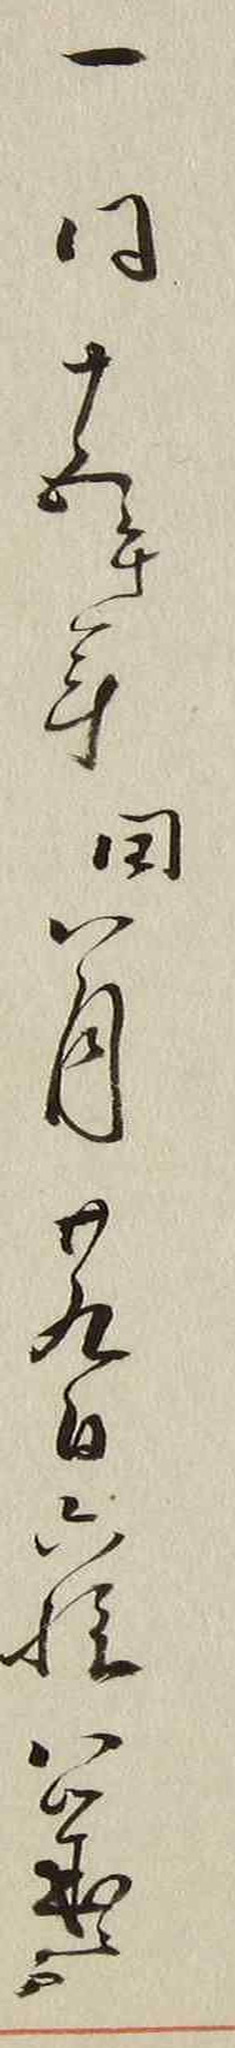一同十五午年閏八月廿九日六拾八歳に而
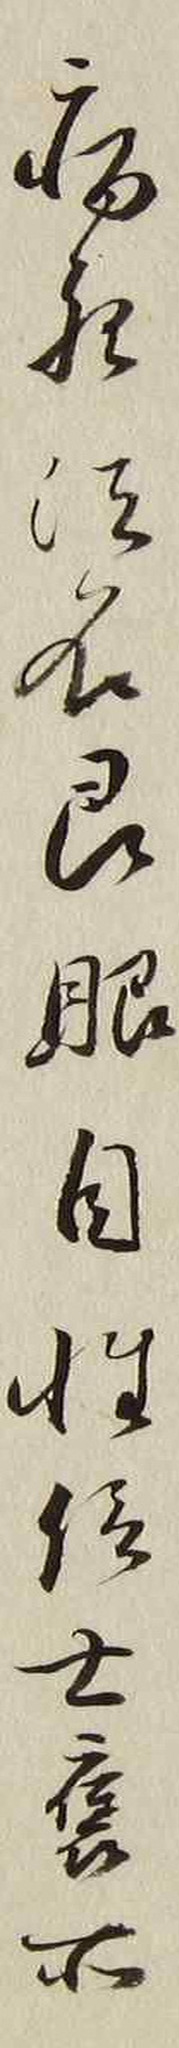病死法名即眼自性信士褒所
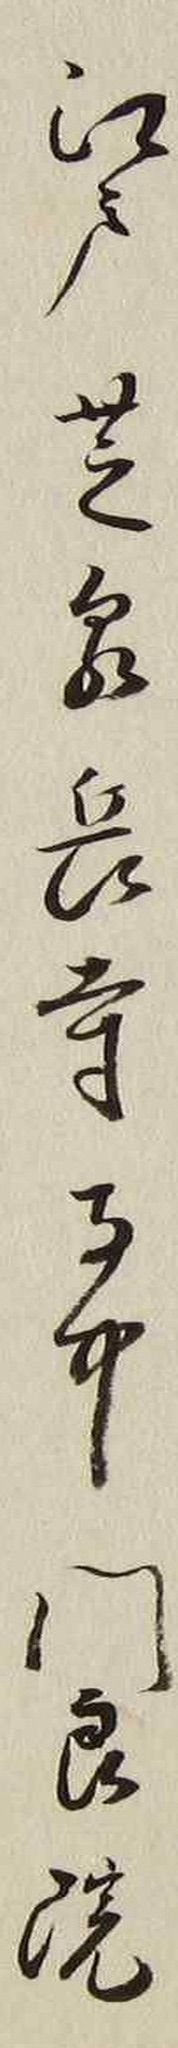江戸芝泉岳寺寺中門良院

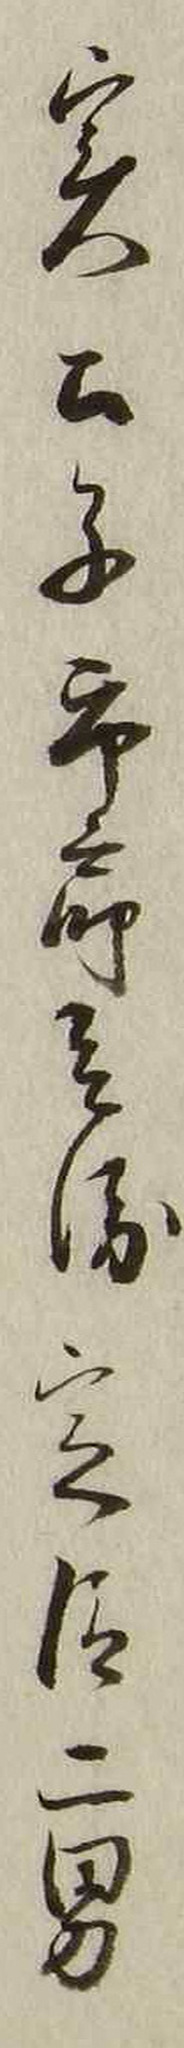実公子市郎兵衛定臣二男
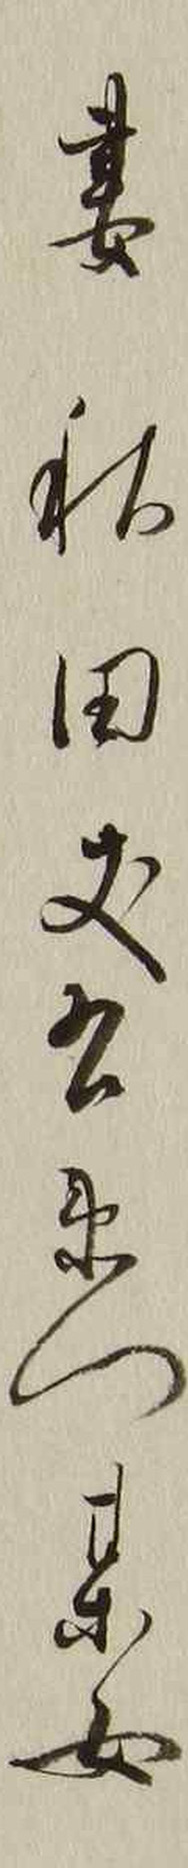妻秋田丈右衛門某女
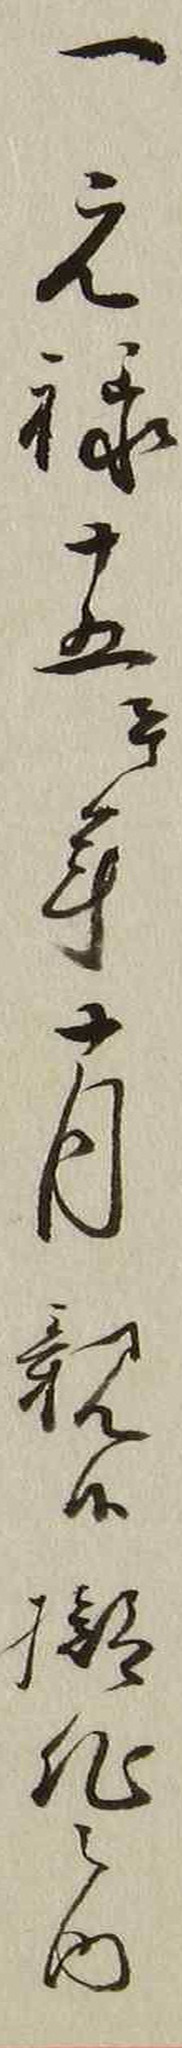一元禄十五午年十月親御擬作之内
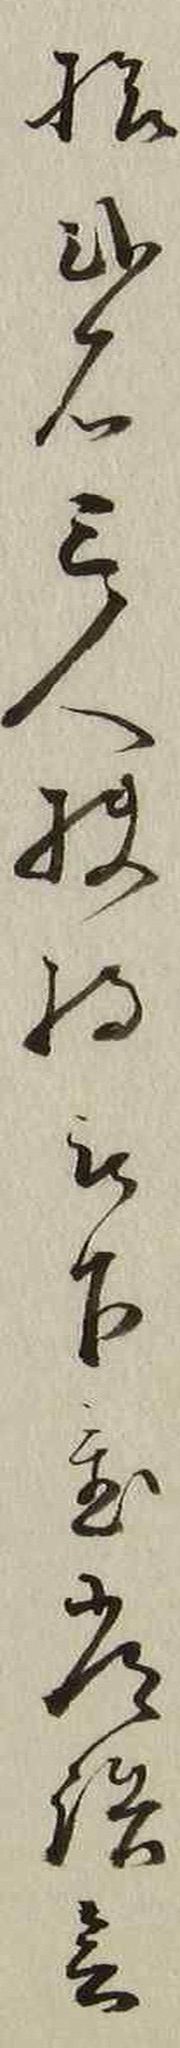拾弐石三人扶持被下置常詰会
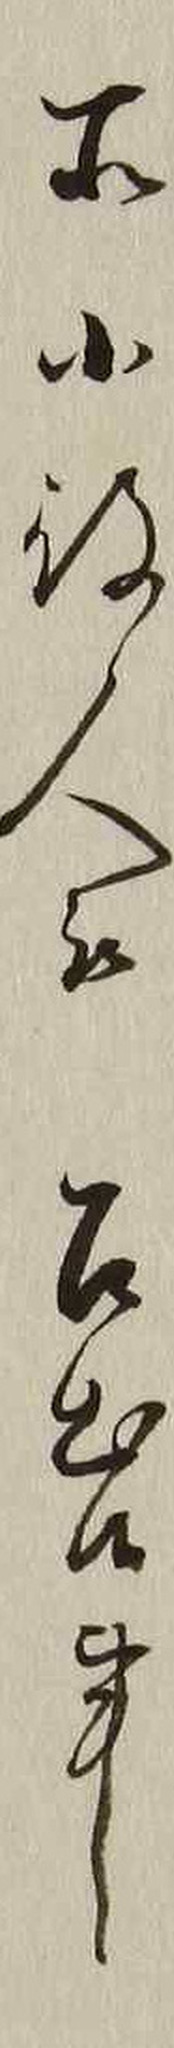所小役人被召出候事
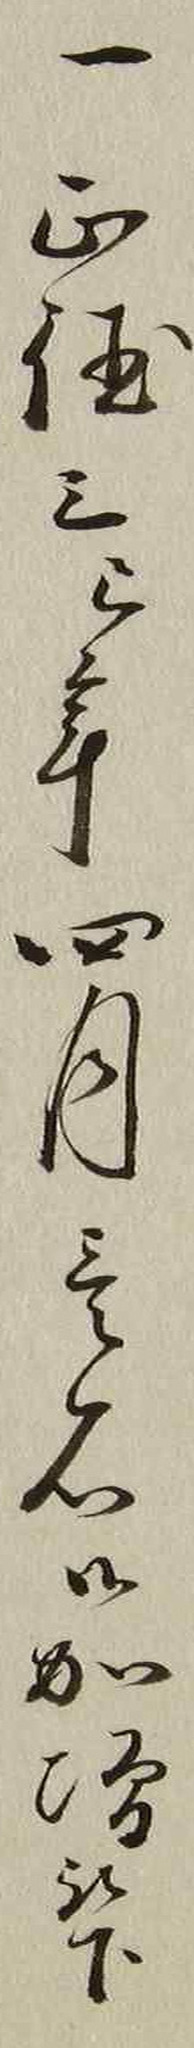一正徳三巳年四月壱石御加増被下
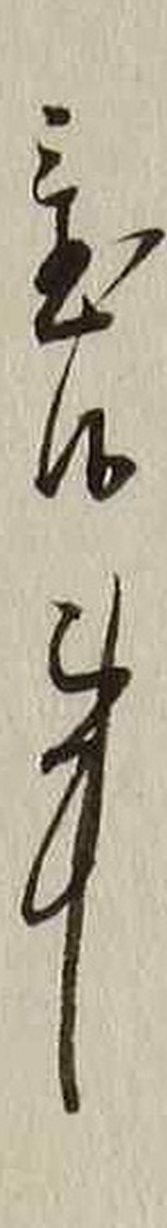置候事
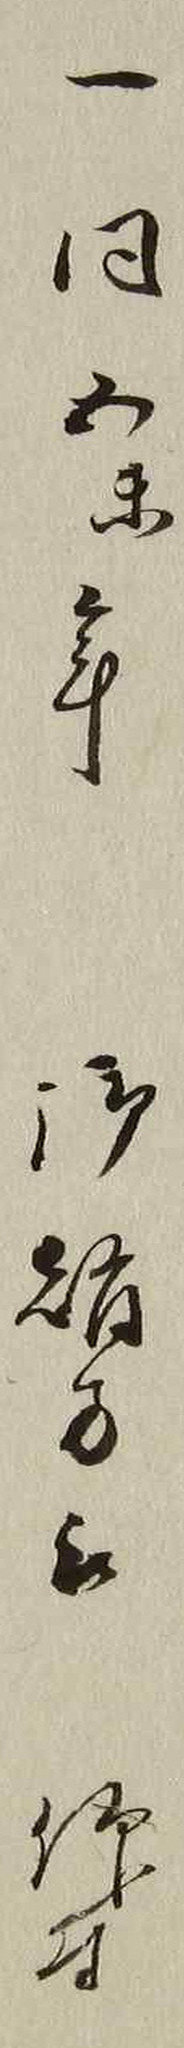一同五未年御賄方被仰付
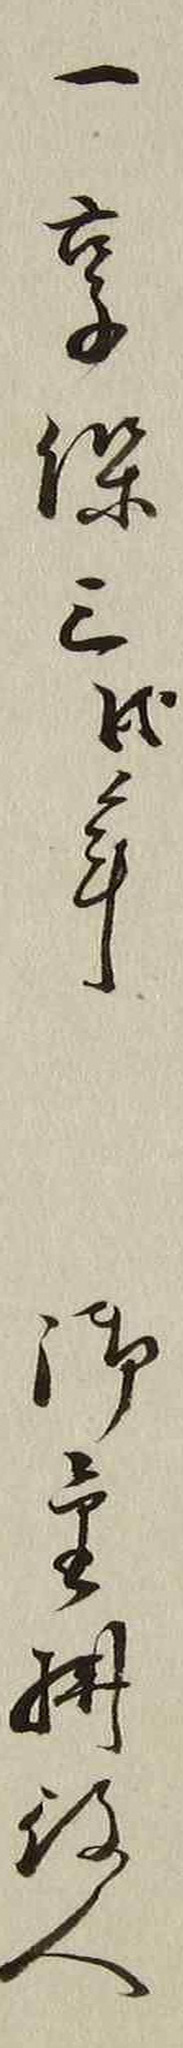一享保三戌年御金払役人
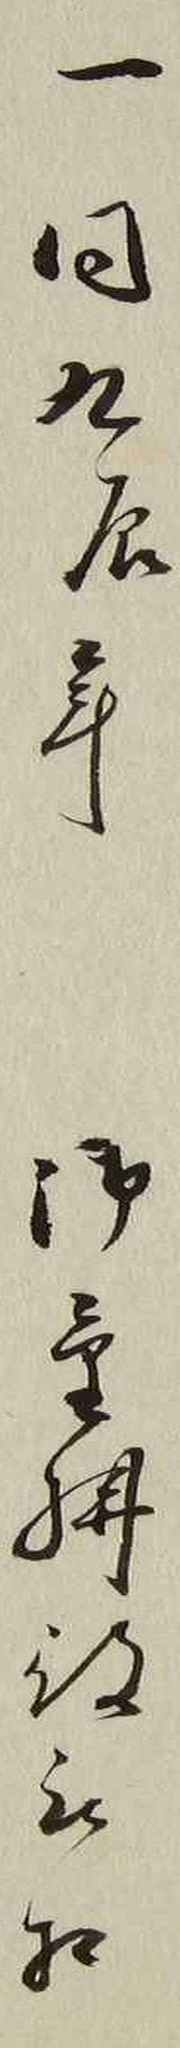一同九辰年御金払役被相
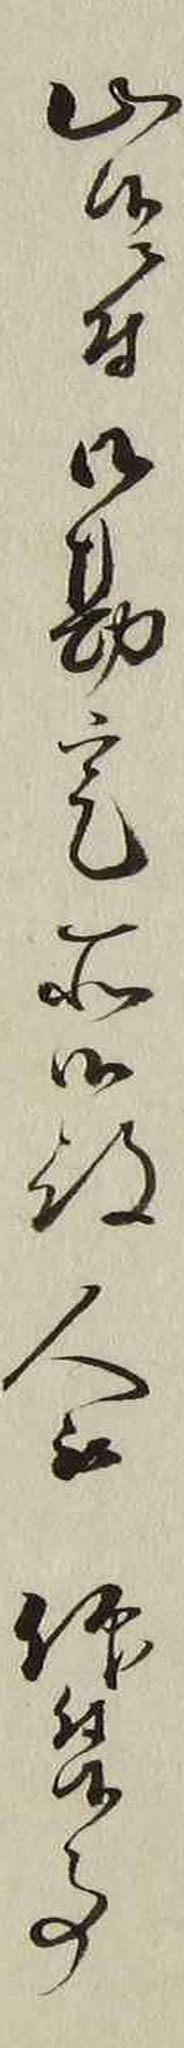止候に付御勘定所御役人被仰付候事
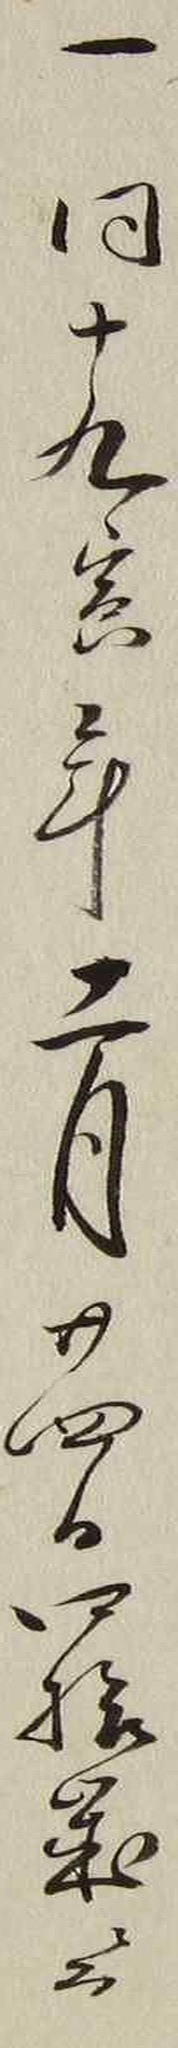一同十九寅年十二月廿四日四拾歳に而
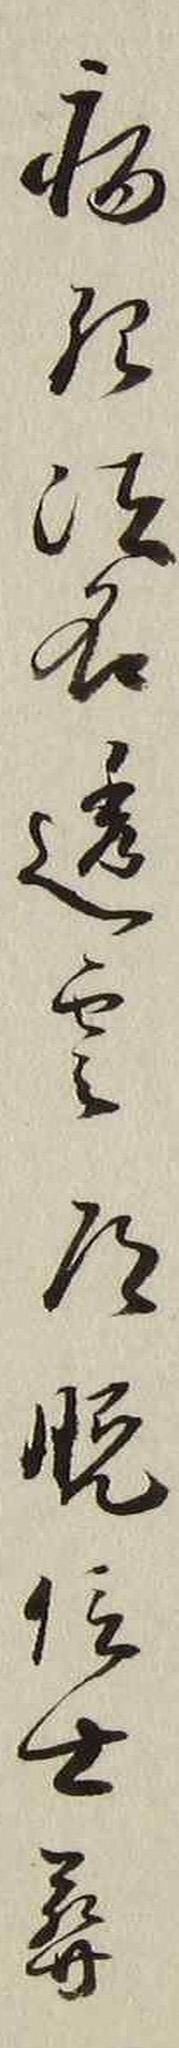病死法名透雲道悦信士葬
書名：諸士系譜　巻之158　ね之部2
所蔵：会津若松市立会津図書館
